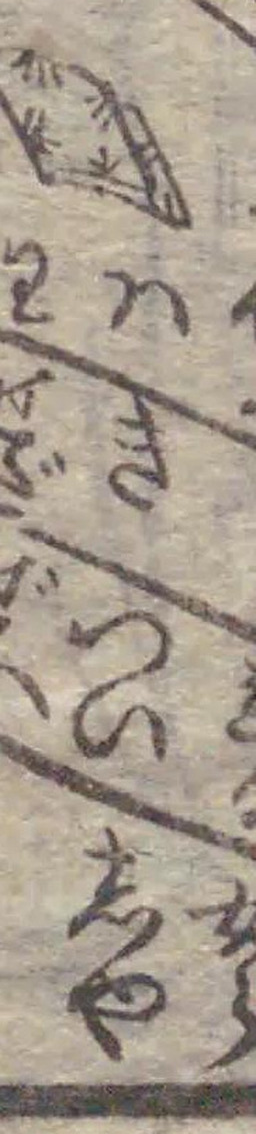はきついしや
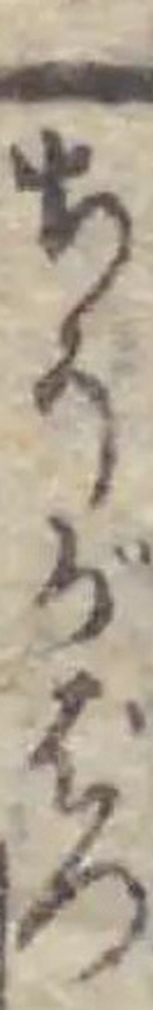ちうがばつ
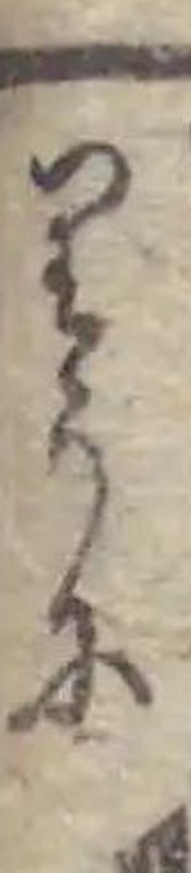りうに
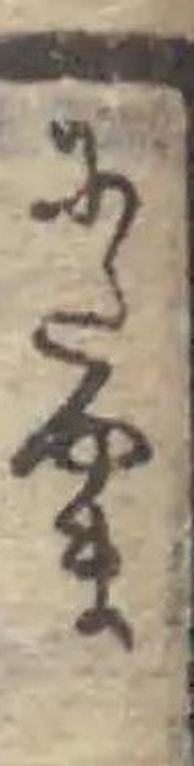にたやま
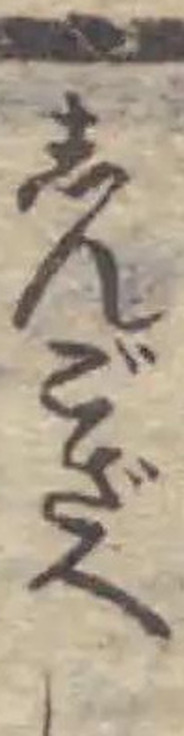しんござへ
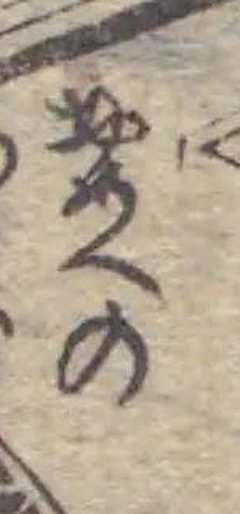おめへの
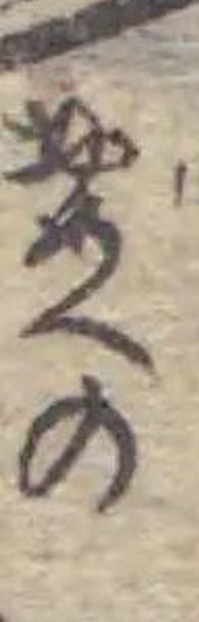おめへの
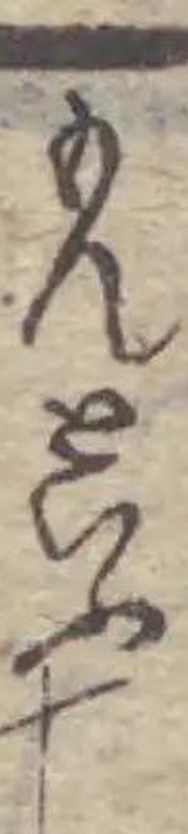もんといふ
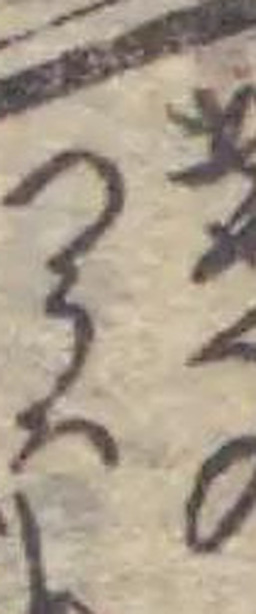つうは
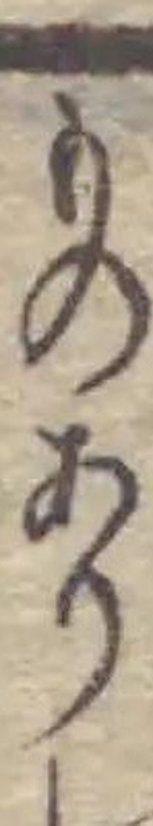ものあり
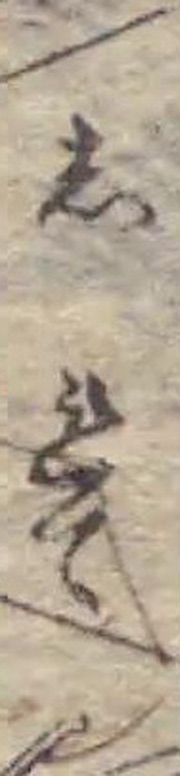しれて
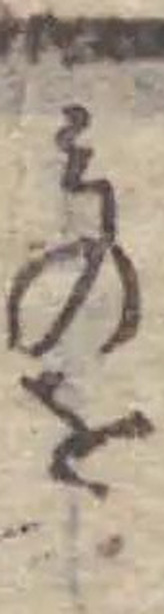みのを
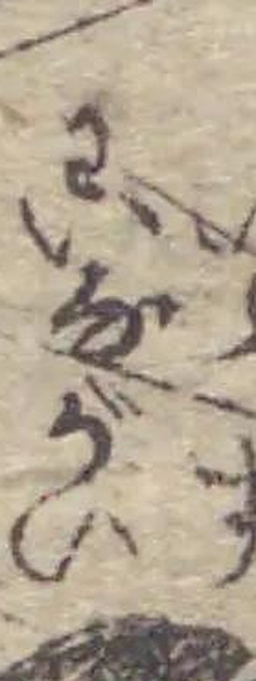わいながい
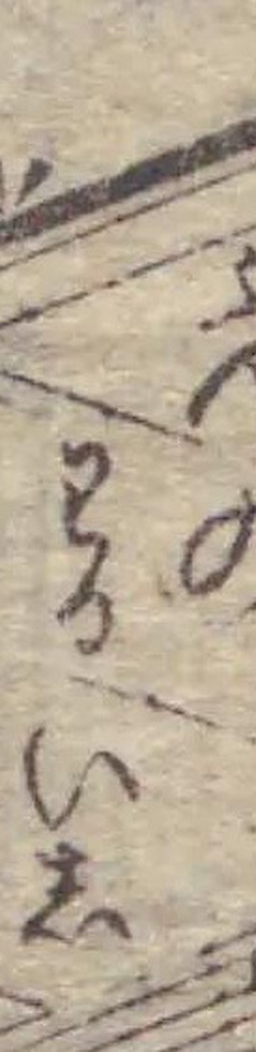わるいし
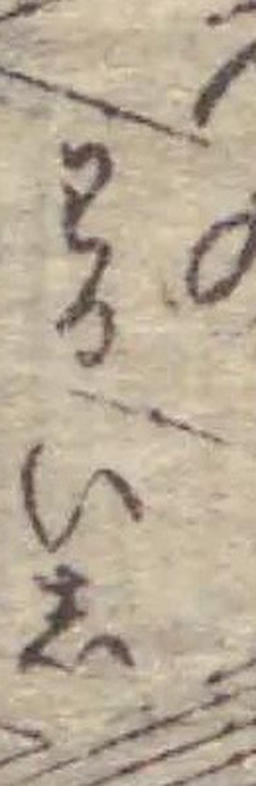わるいし
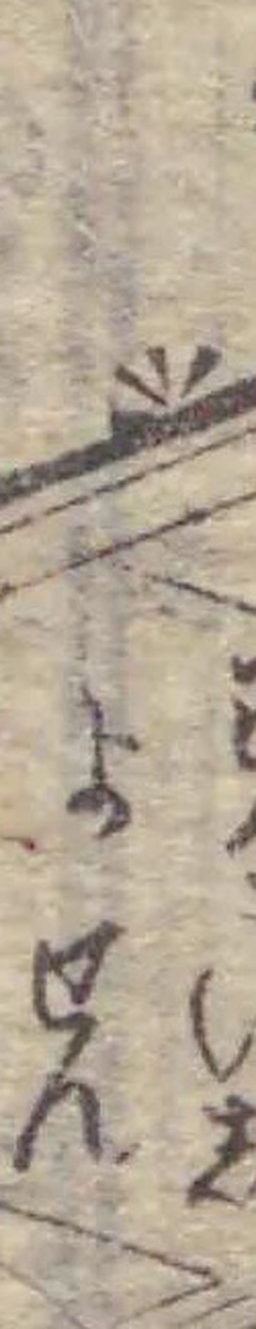よせん
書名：かんなんの夢枕 2巻
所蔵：国立国会図書館 National Diet Library, JAPAN
